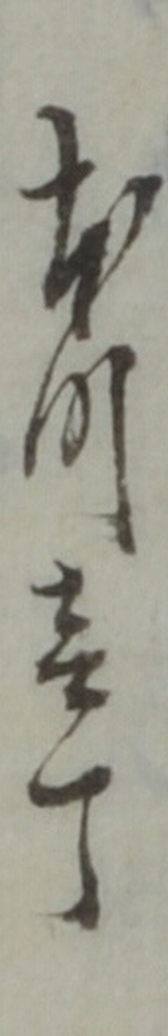本町壱丁
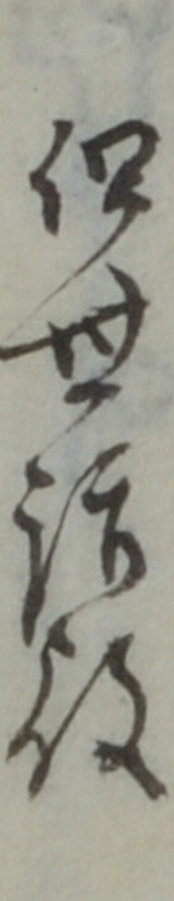但世話役
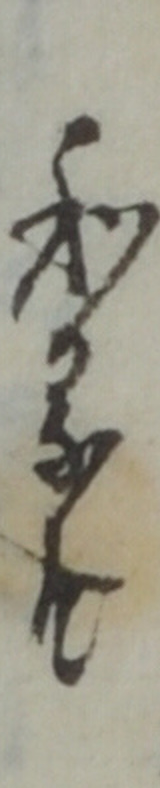和泉屋
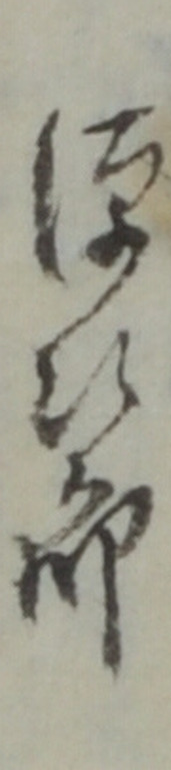源次郎
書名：申渡書（写）
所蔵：伊那市立高遠町図書館・合同会社AMANE
